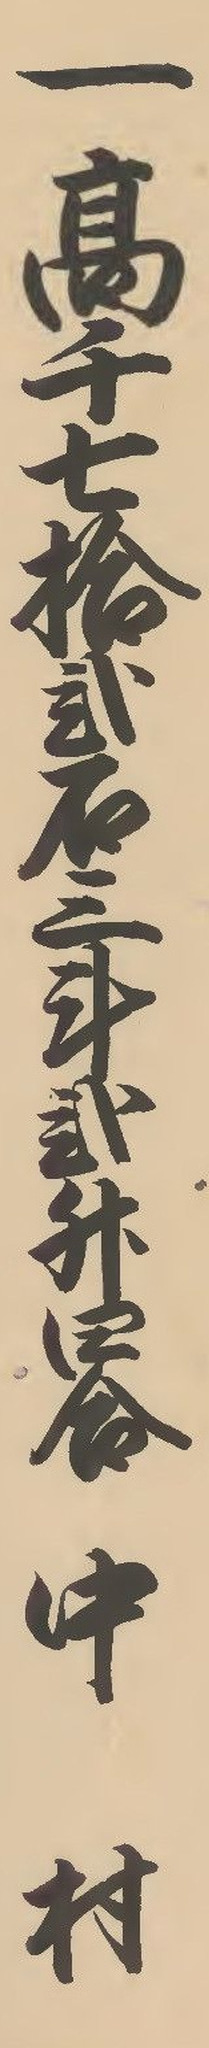一髙千七拾弐石三斗弐升四合中村
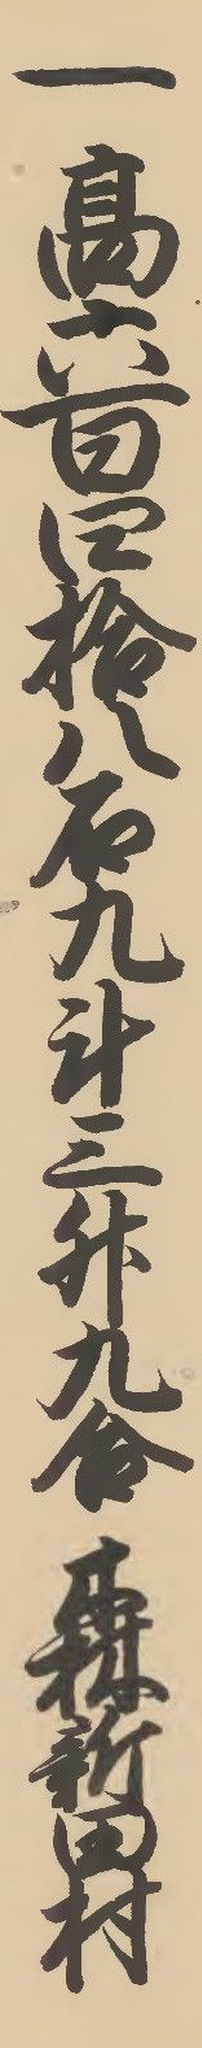一髙六百四拾八石九斗三升九合森新田村
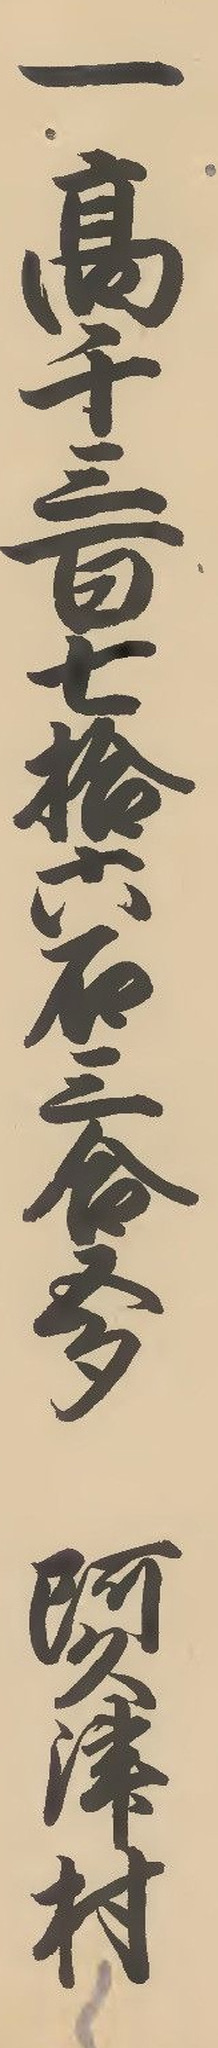一髙千三百七拾六石三合五夕阿久津村
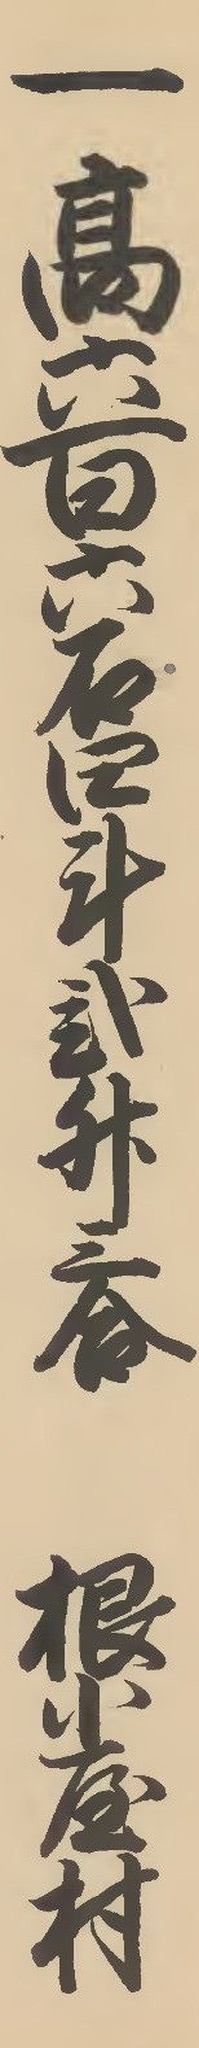一髙六百六石四斗弐升三合根小屋村
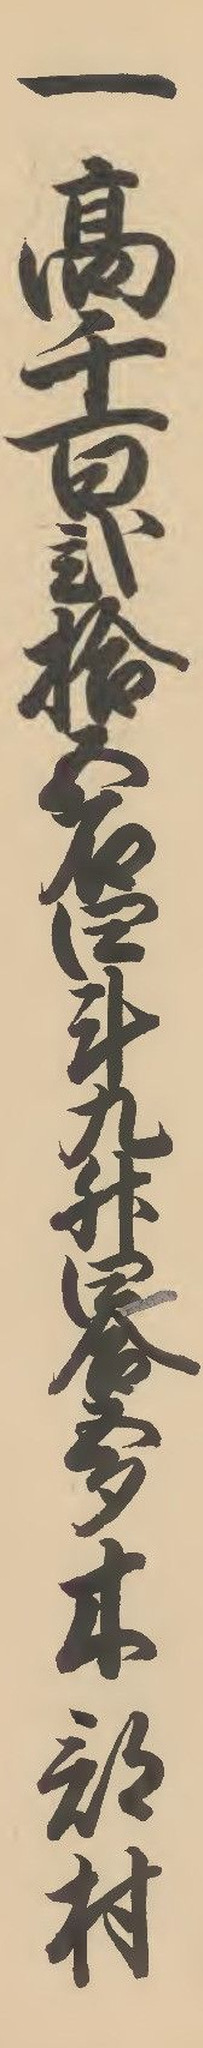一髙千百弐拾五石四斗九升四合五夕木部村

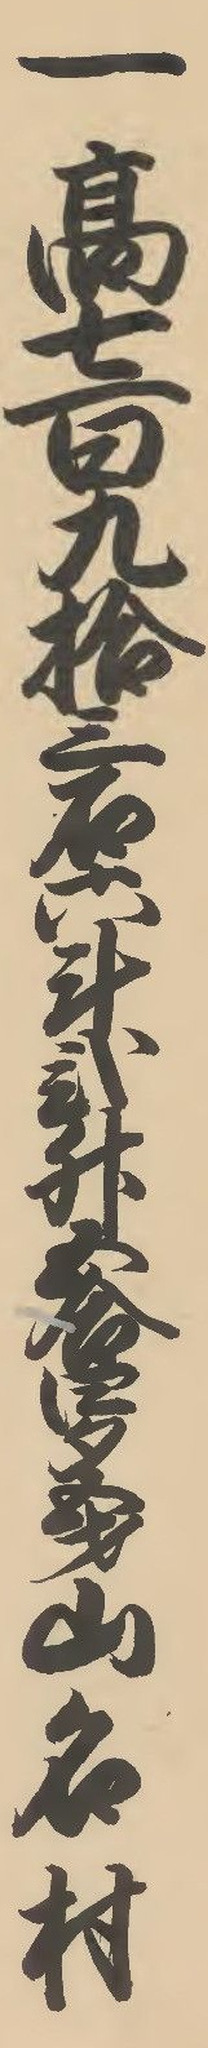一髙七百九拾三石六斗弐升五合四夕五才
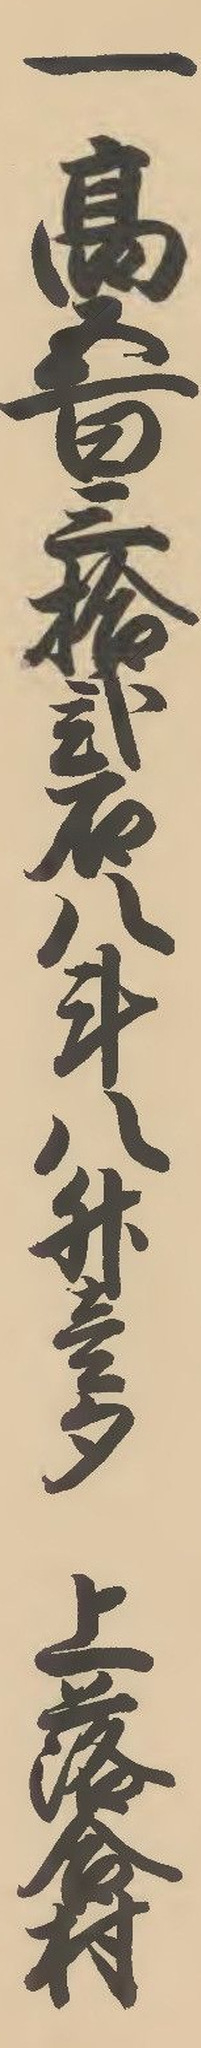一髙五百三拾弐石八斗八升壱夕上落合村
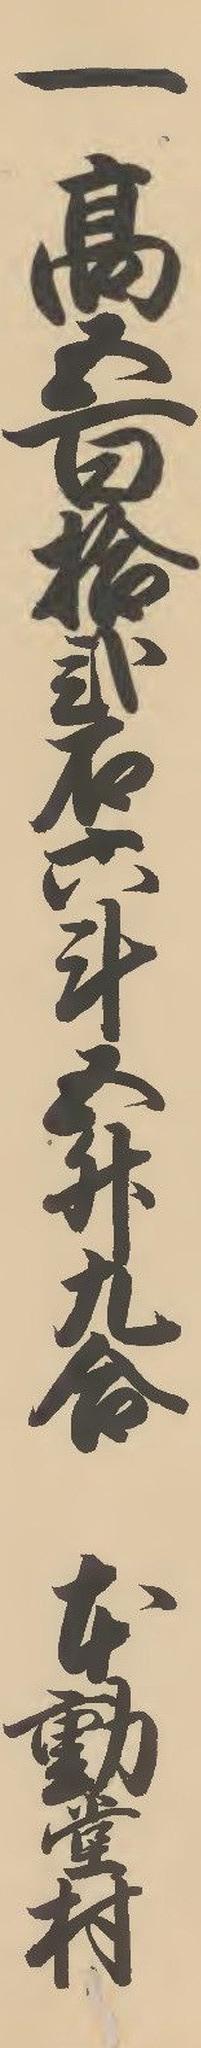一髙五百拾弐石六斗五升九合本動堂村
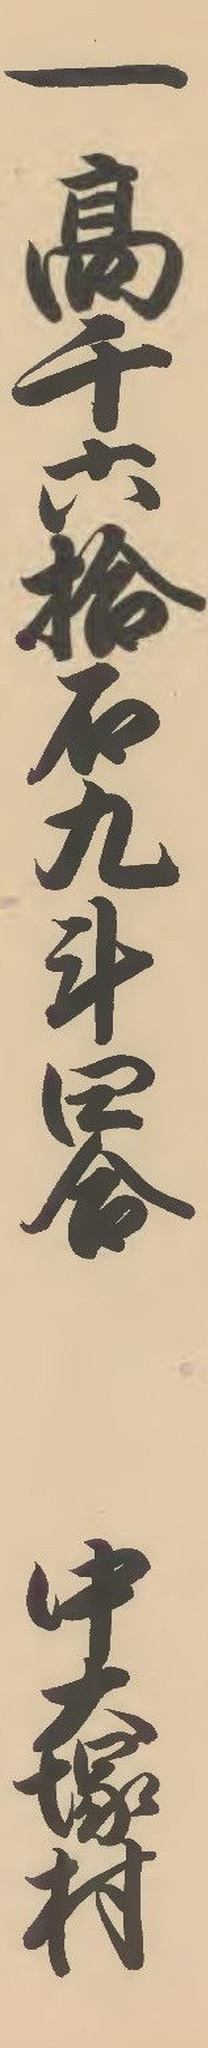一髙千六拾石九斗四合中大塚村
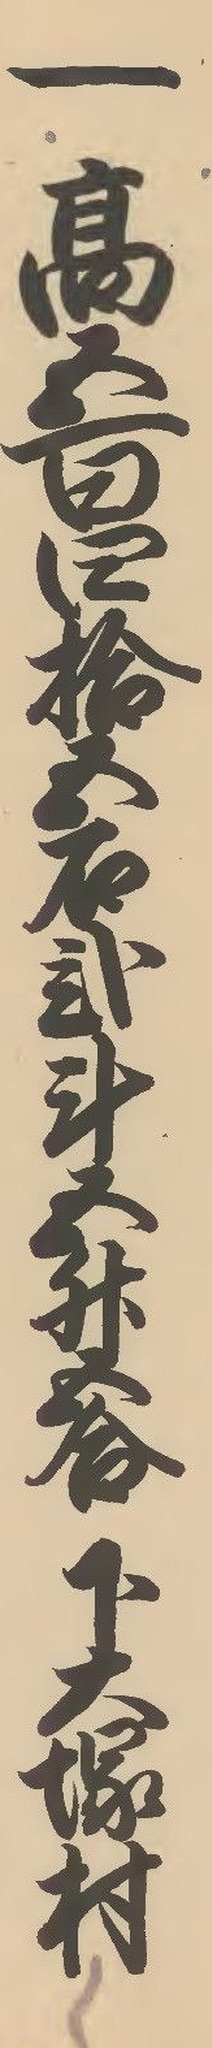一髙五百四拾五石弐斗五升五合下大塚村
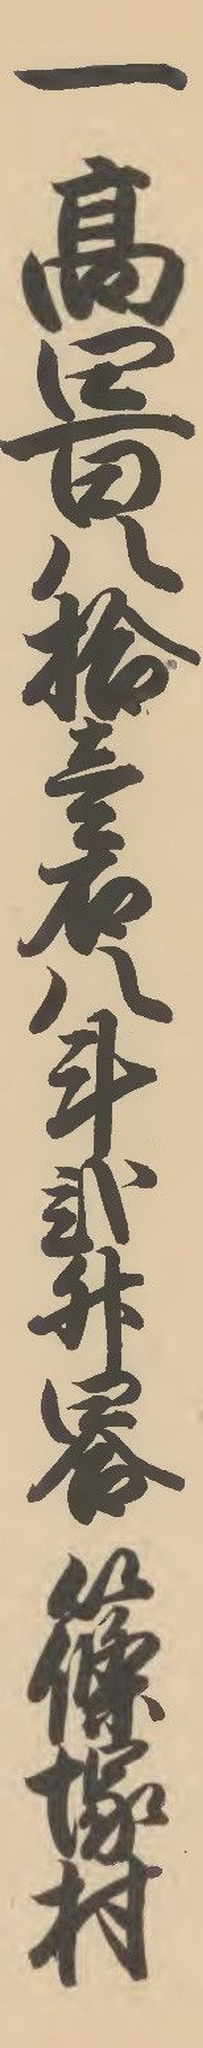一髙四百八拾壱石八斗弐升四合篠塚村
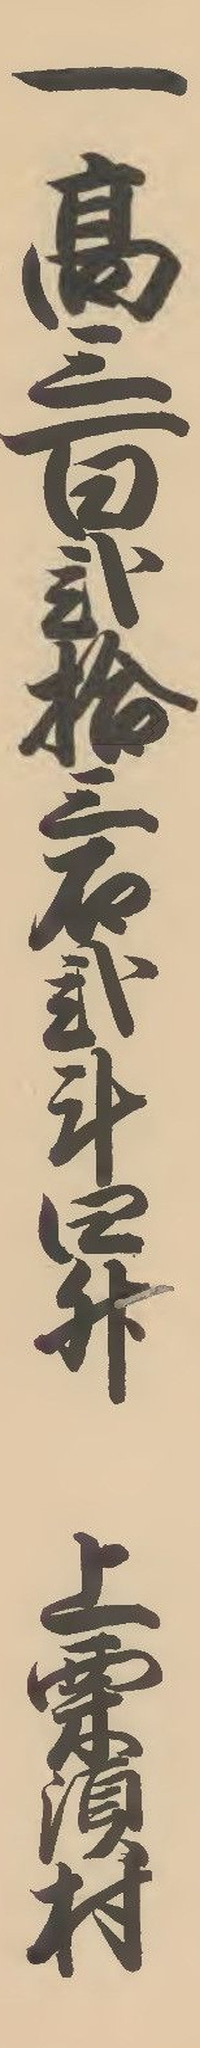一髙三百弐拾三石弐斗四升上栗須村

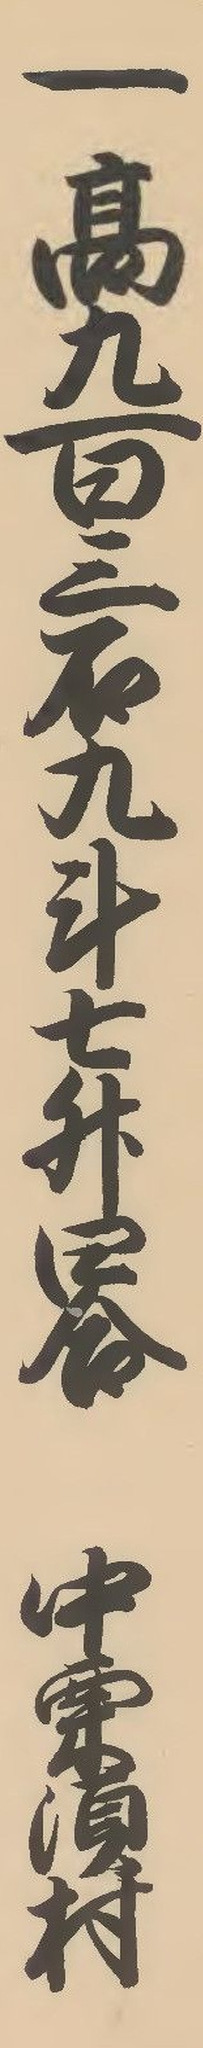一髙九百三石九斗七升四合中栗須村
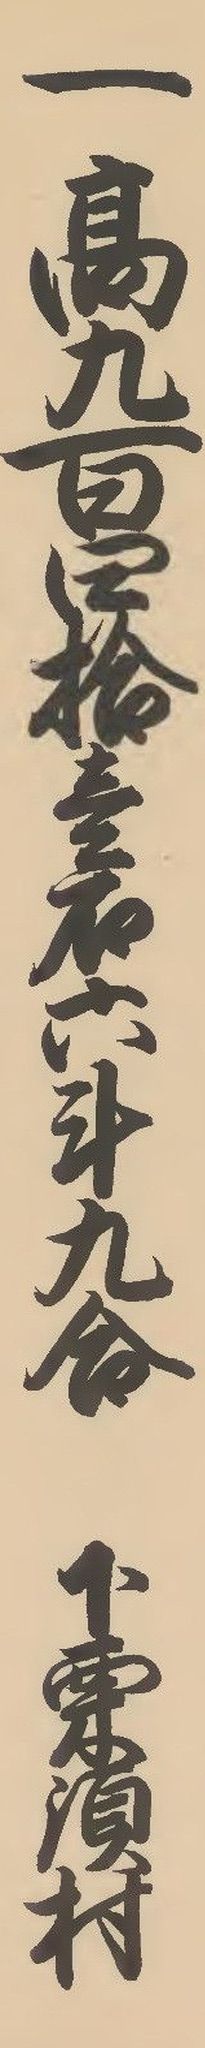一髙九百四拾壱石六斗九合下栗須村
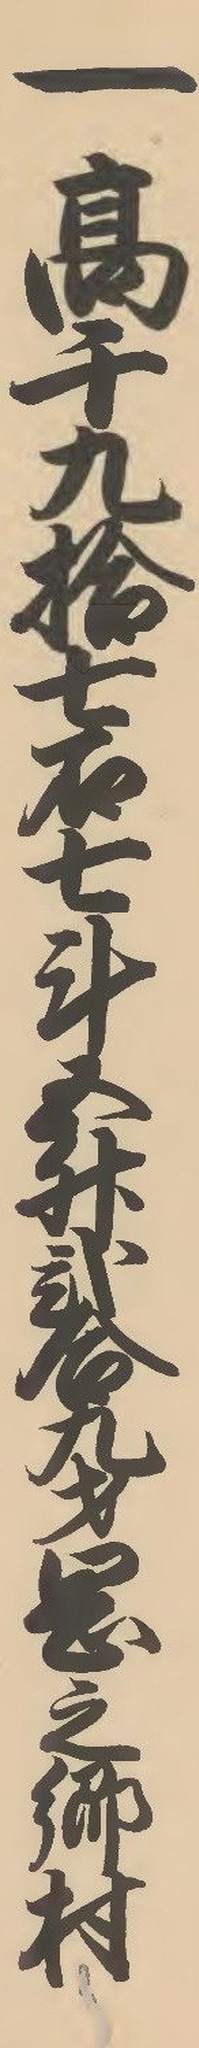一髙千九拾七石七斗五升弐合九才岡之郷村
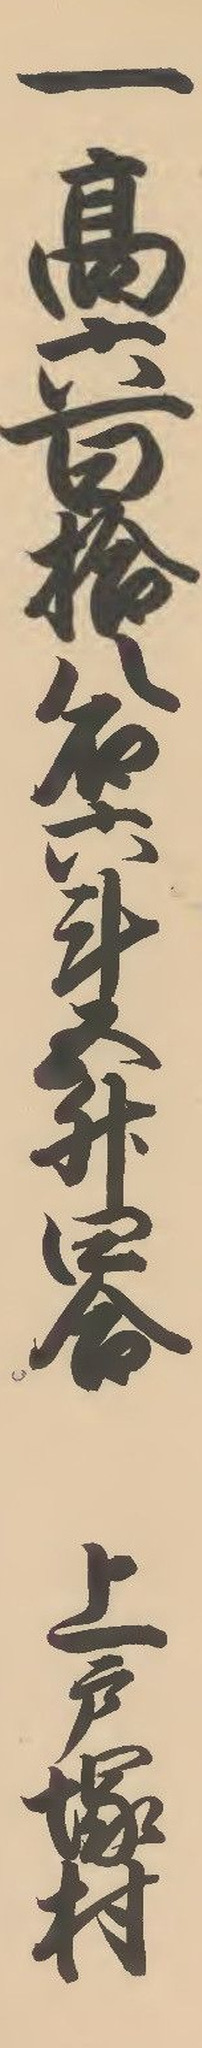一髙六百拾八石六斗五升四合上戸塚村
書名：上野国郷帳
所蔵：国立公文書館 National Archives of Japan
